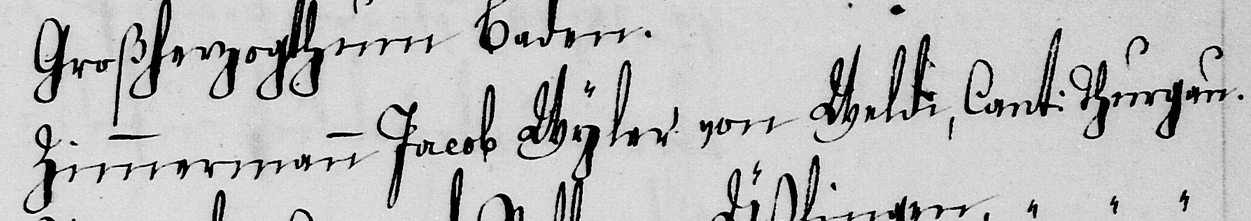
Zimmermann Jacob Wyler von Wald, Cant: Thurgau.
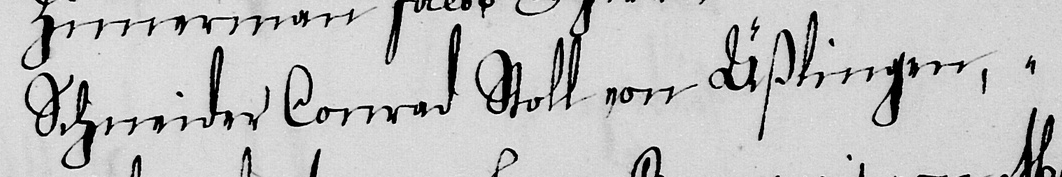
Schneider Conrad Stoll von Üßlingen, “
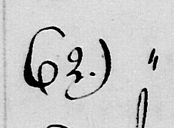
62.)
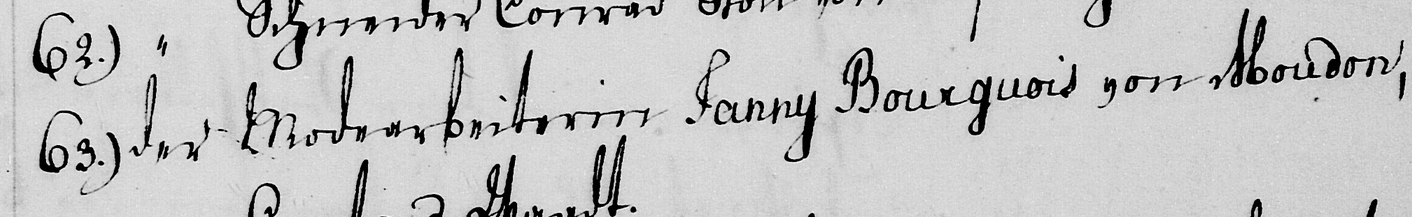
63.) der Modearbeiterin Fanny Bourguois von Moudon,
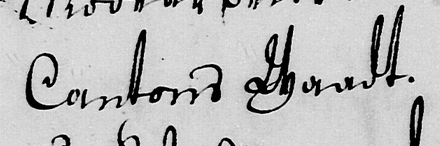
Cantons Waadt.
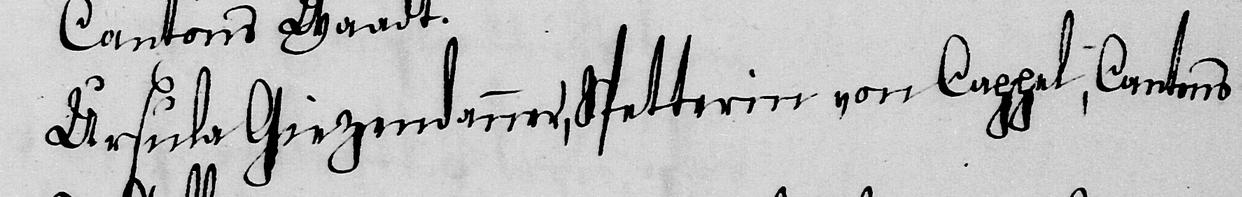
Ursula Giezendanner, Spetterin von Cappel, Cantons
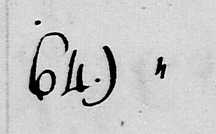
66.)
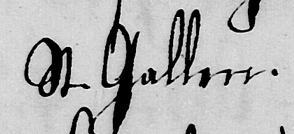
St. Gallen.
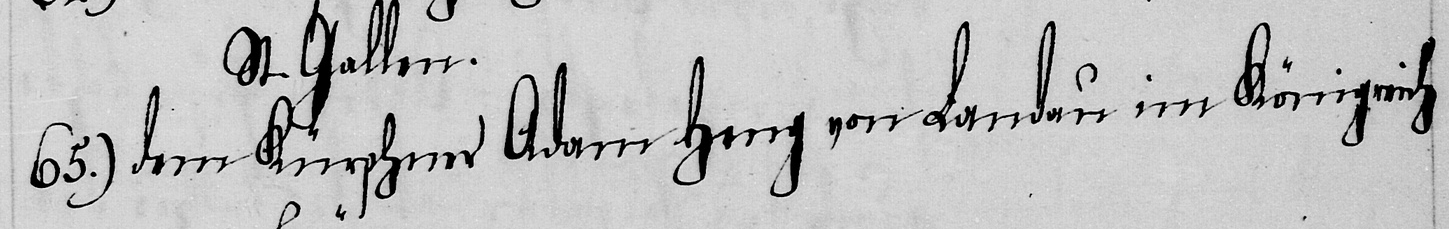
65.) dem Kürschner Adam Heng von Landau im Königreich
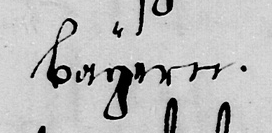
Bayern.
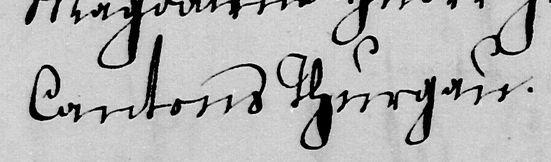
Cantons Thurgau.
